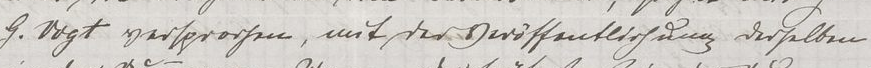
G. Vogt versprochen, mit der Veröffentlichung derselben
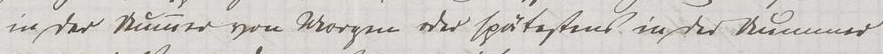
in der Nummer von Morgen oder spätestens in der Nummer
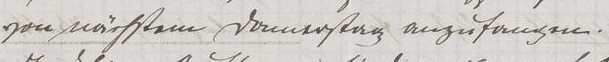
von nächstem Donnerstag anzufangen.
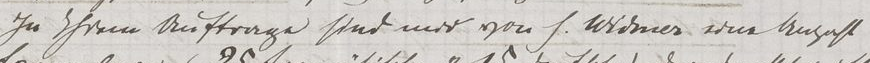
In Ihrem Auftrage sind mir von H. Widmer eine Anzahl
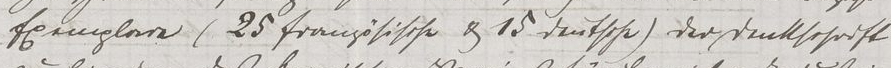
Exemplare (25 französische & 15 deutsche) der Denkschrift
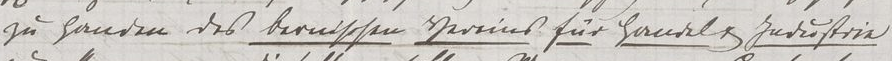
zu Handen des bernischen Vereins für Handel & Industrie
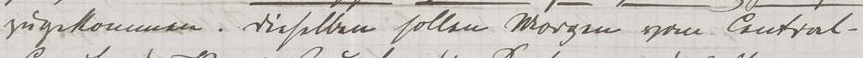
zugekommen. Dieselben sollen Morgen vom Central-
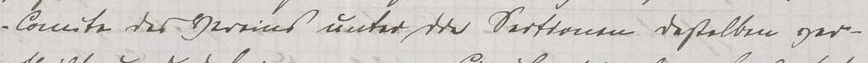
Comite des Vereins unter die Sectionen deßelben ver-
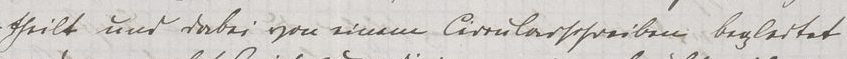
theilt und dabei von einem Circularschreiben begleitet
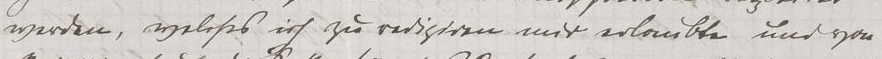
werden, welches ich zu redigiren mir erlaubte und von
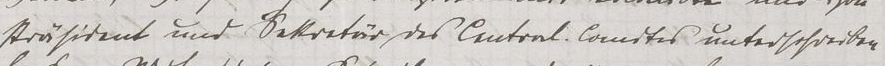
Präsident und Sekretär des Central-Comites unterschreiben
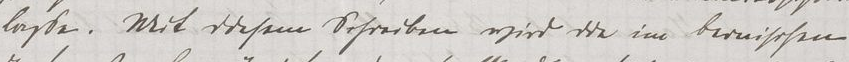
lasse. Mit diesem Schreiben wird die im bernischen
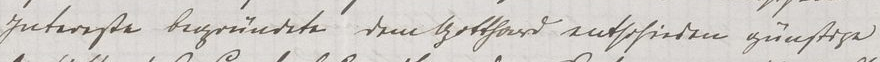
Intereße begründete dem Gotthard entschieden günstige
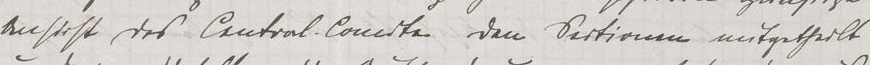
Ansicht des Central-Comite den Sectionen mitgetheilt
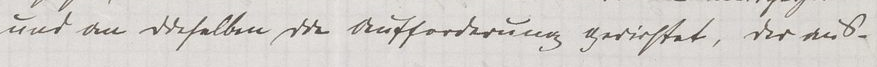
und an dieselben die Aufforderung gerichtet, der aus-
